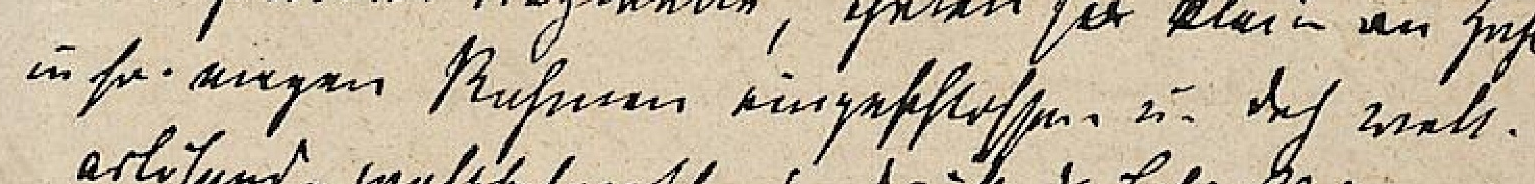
in so engen Rahmen eingeschlossen u. doch welt¬
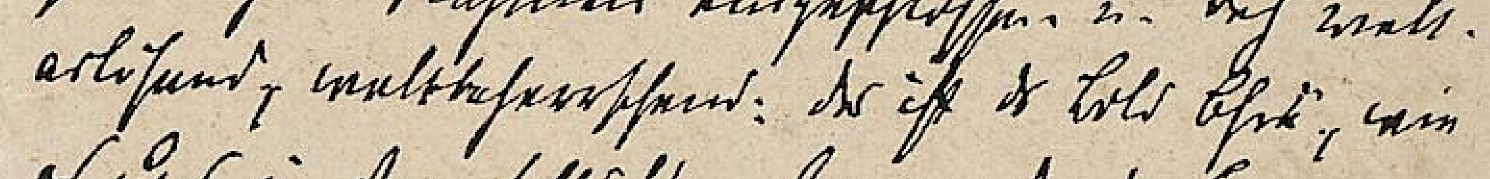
erlösend, weltbeherrschend: das ist ds Bild Chri, wie
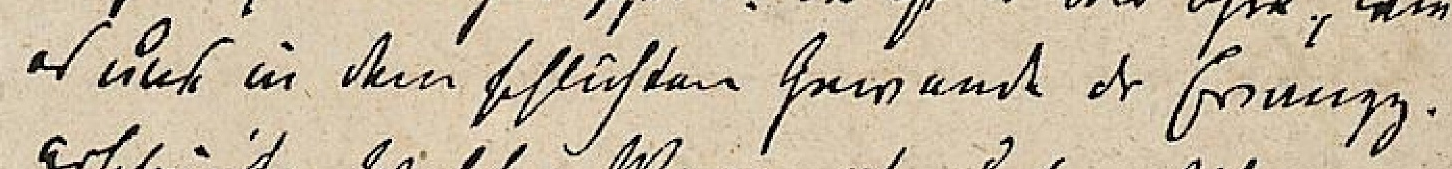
es uns in dem schlichten Gewand dr Evangg.
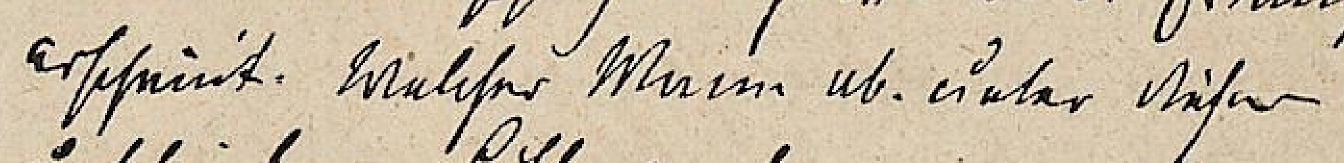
erscheint. Welcher Mann ab. unter dieser
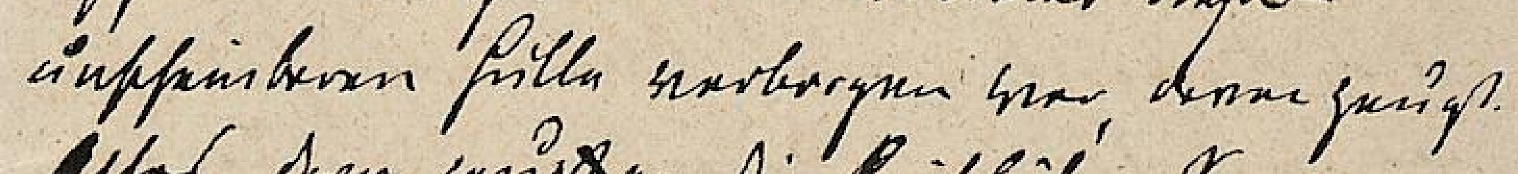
unscheinbaren Hülle verborgen war, davon zeugt
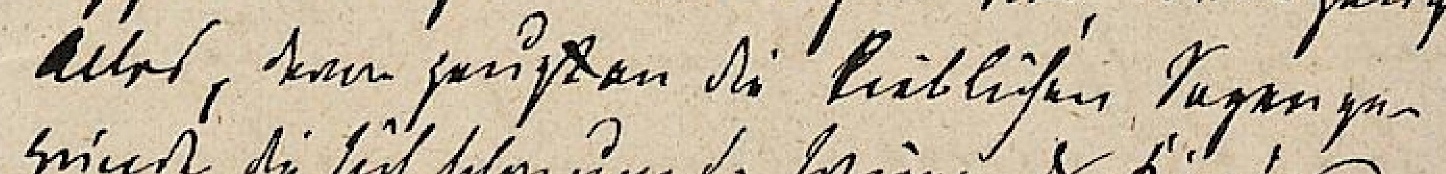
Alles, davon zeugten die lieblichen Sagenge¬
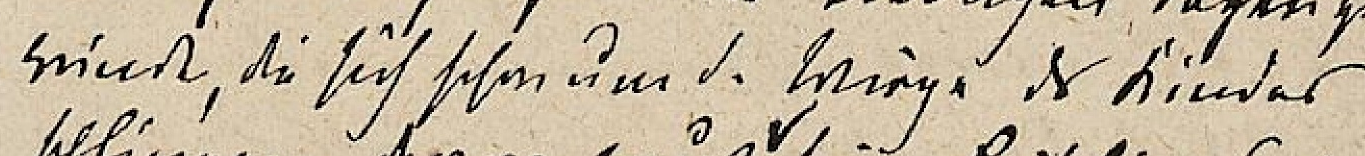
winde die sich schon um d. Wiege ds Kindes
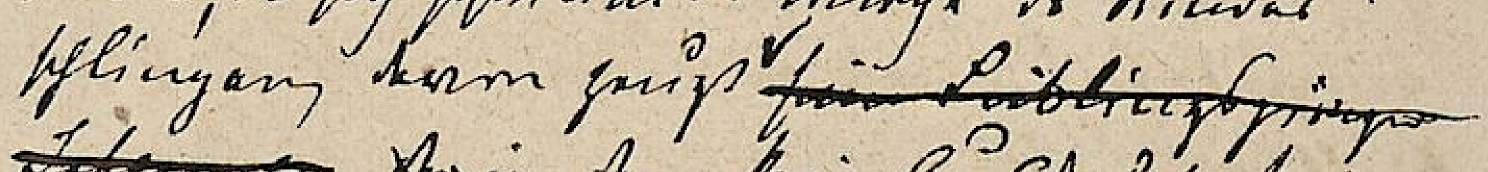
schlingen, davon zeugt sein Lieblingsjünger
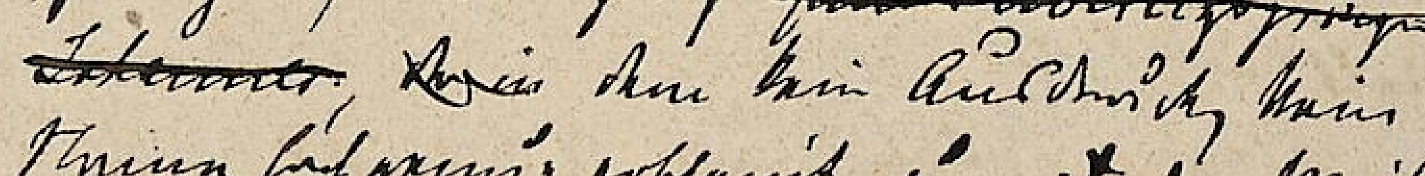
Johannes, der in dem kein Ausdruck, kein
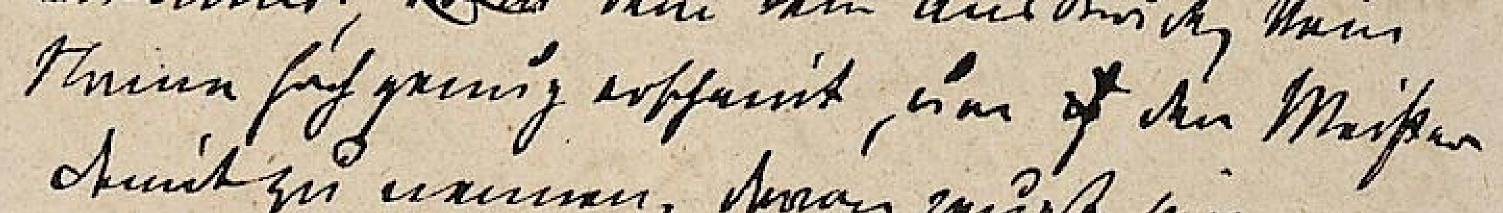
Name hoch genug erscheint, um ih den Meister
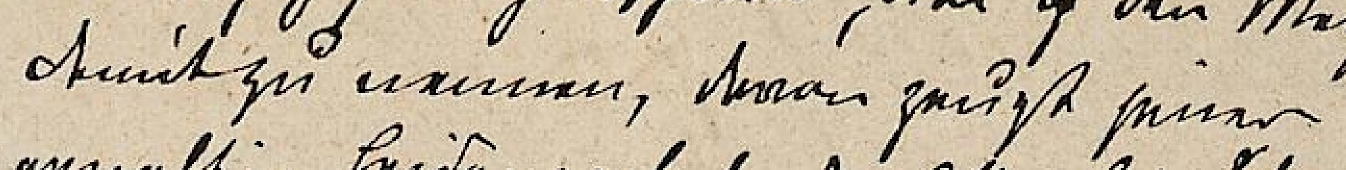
damit zu nennen, davon zeugt jener
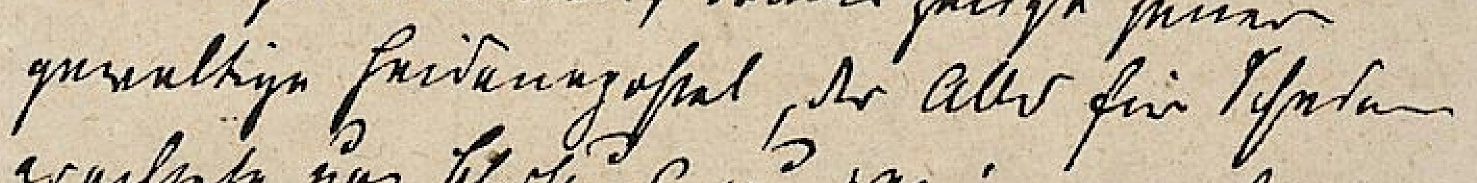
gewaltige Heidenapostel der Alles für Schaden
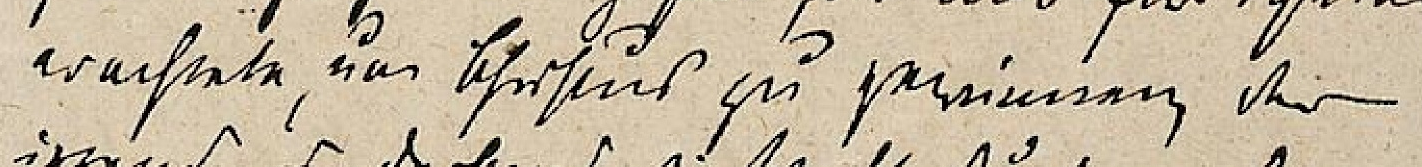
erachete, um Christus zu gewinnen, der
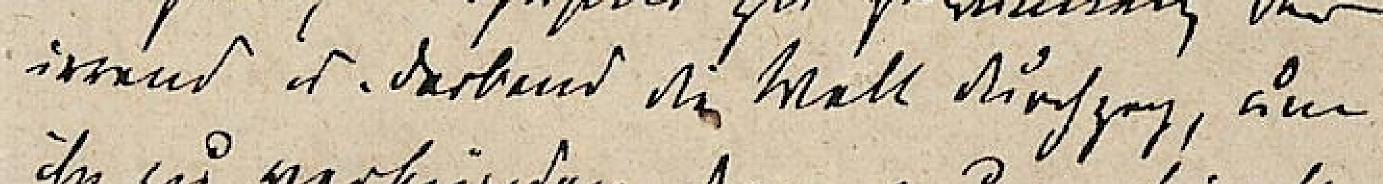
irrend u. derbend die Welt durchzog, um
